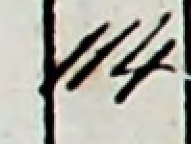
114
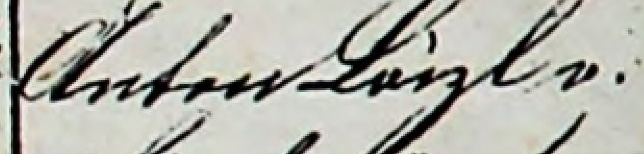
Anton Loizl v.
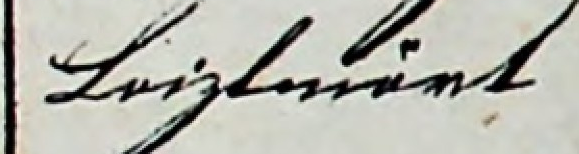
Loizlmört
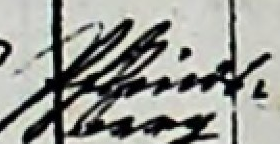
Pflinds„
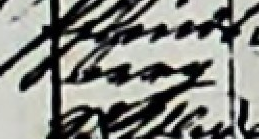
berg
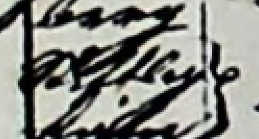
Stiftsg.
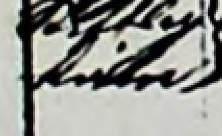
Rain
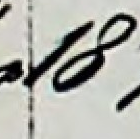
18
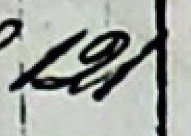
121
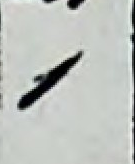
1
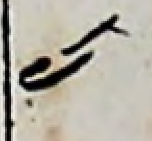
5
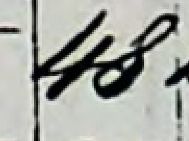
48
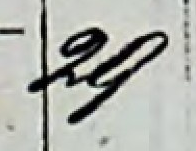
29
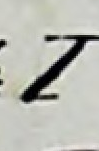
I
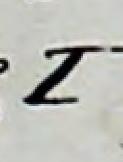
I
